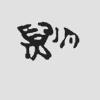則
